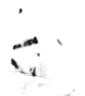女（如）
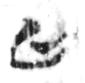㠯（以）
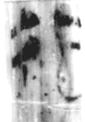行
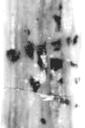必
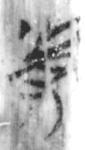○（亡）
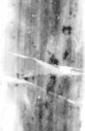又
